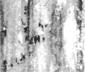生
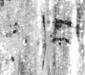才（在）
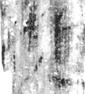子
